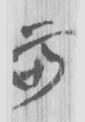可
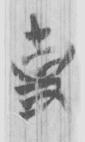吏
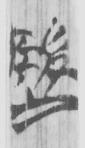{阩止}
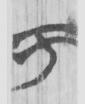于
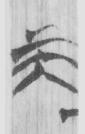天
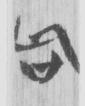句
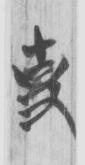吏
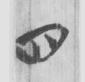四
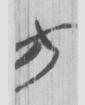方
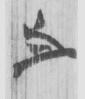之
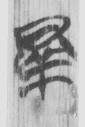羣
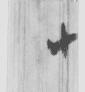七
